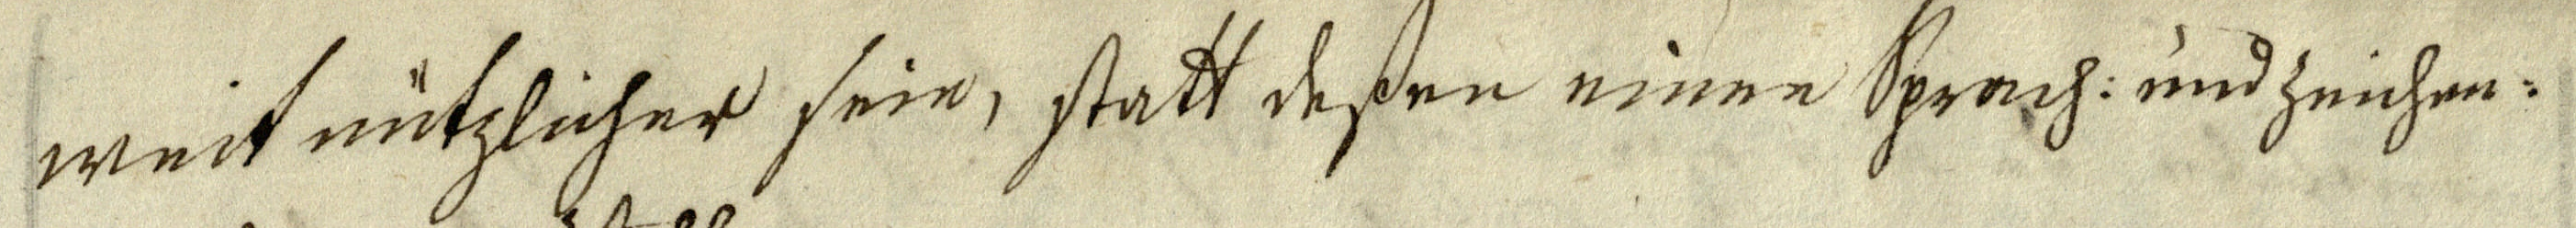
weit nützlicher sein, statt deßen einen Sprach- und Zeichen¬
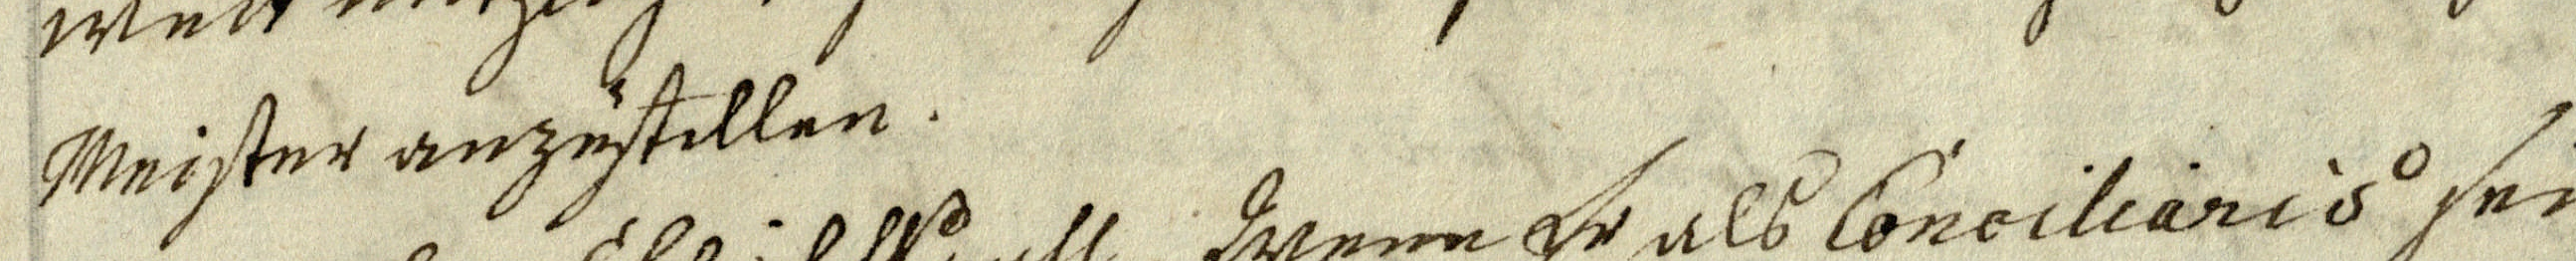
Meister anzustellen.
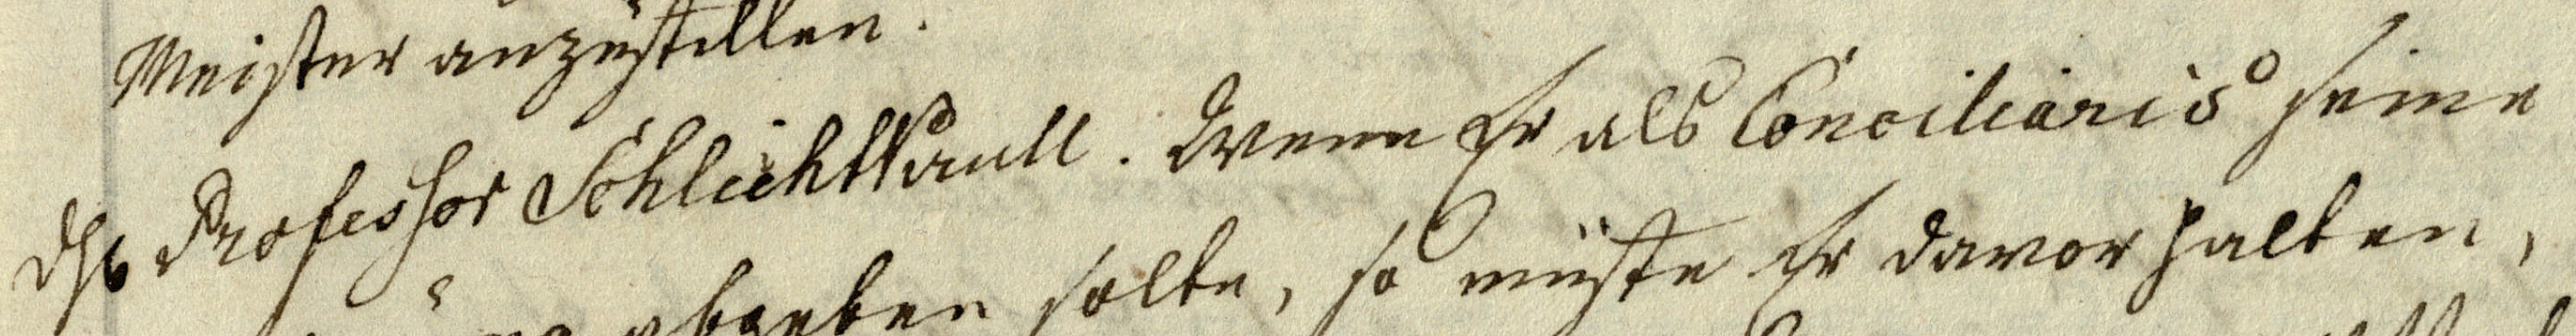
dh Professor Schlichtkrull. Wenn Er als Conciliaris seine
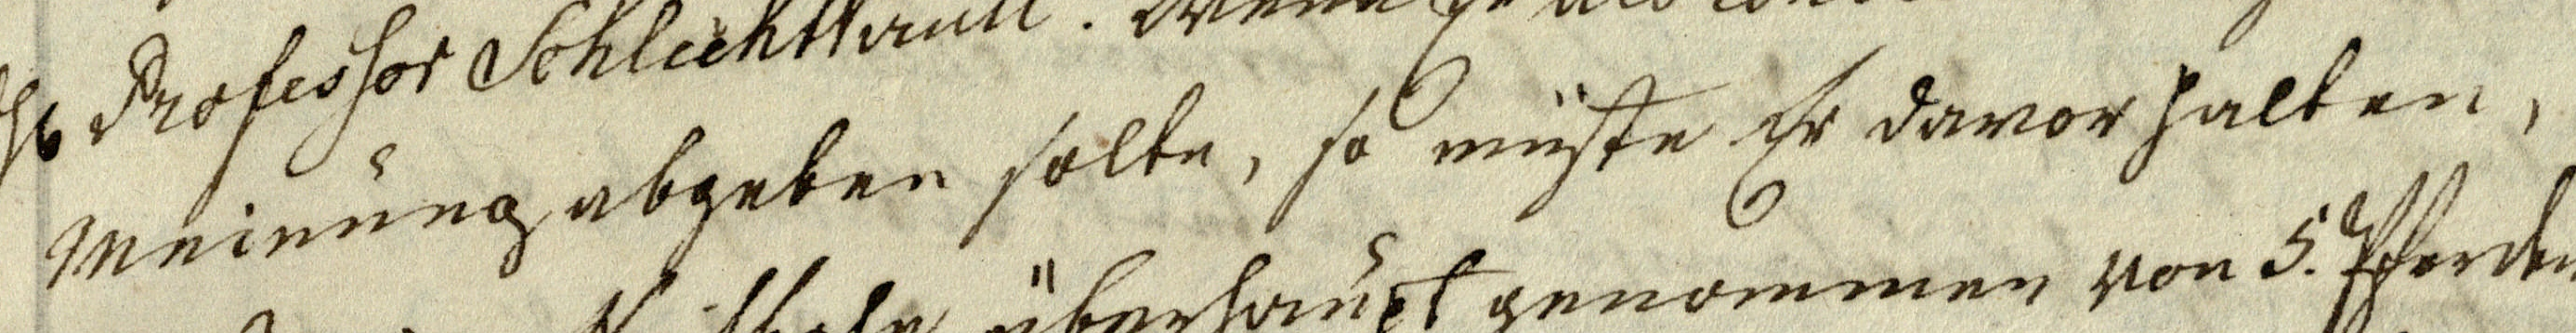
Meinung abgeben solte, so müßte Er davor halten,
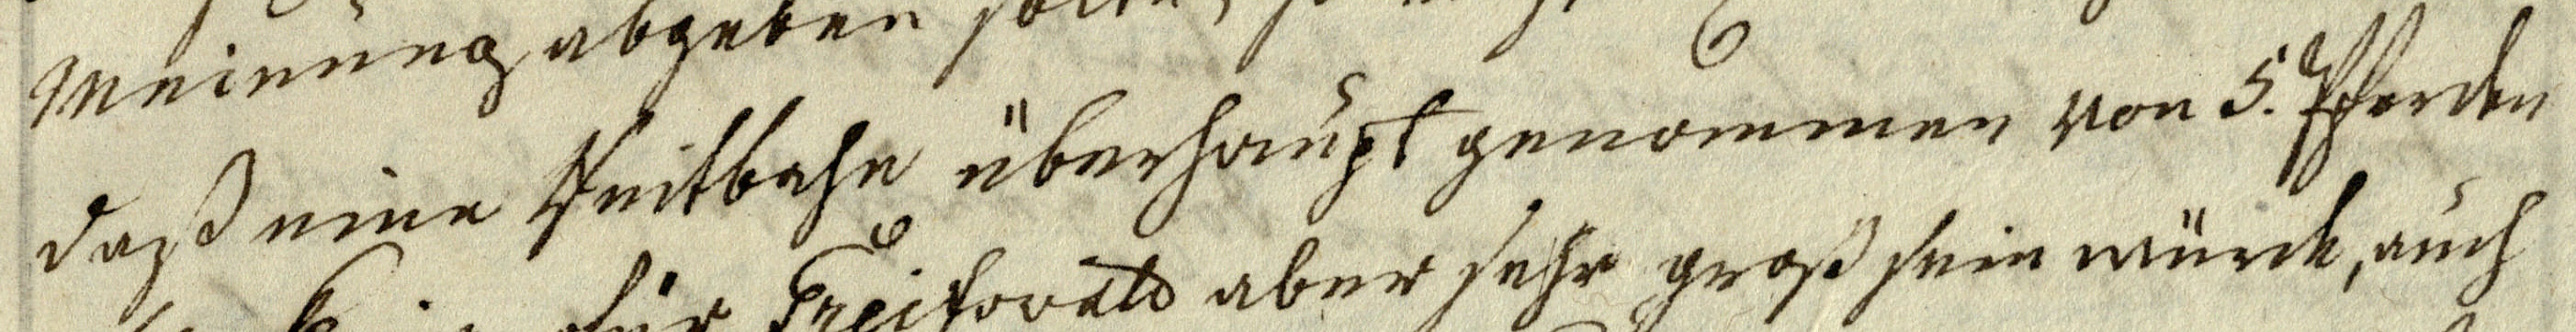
daß eine Reitbahn überhaupt genommen von 5. Pferden
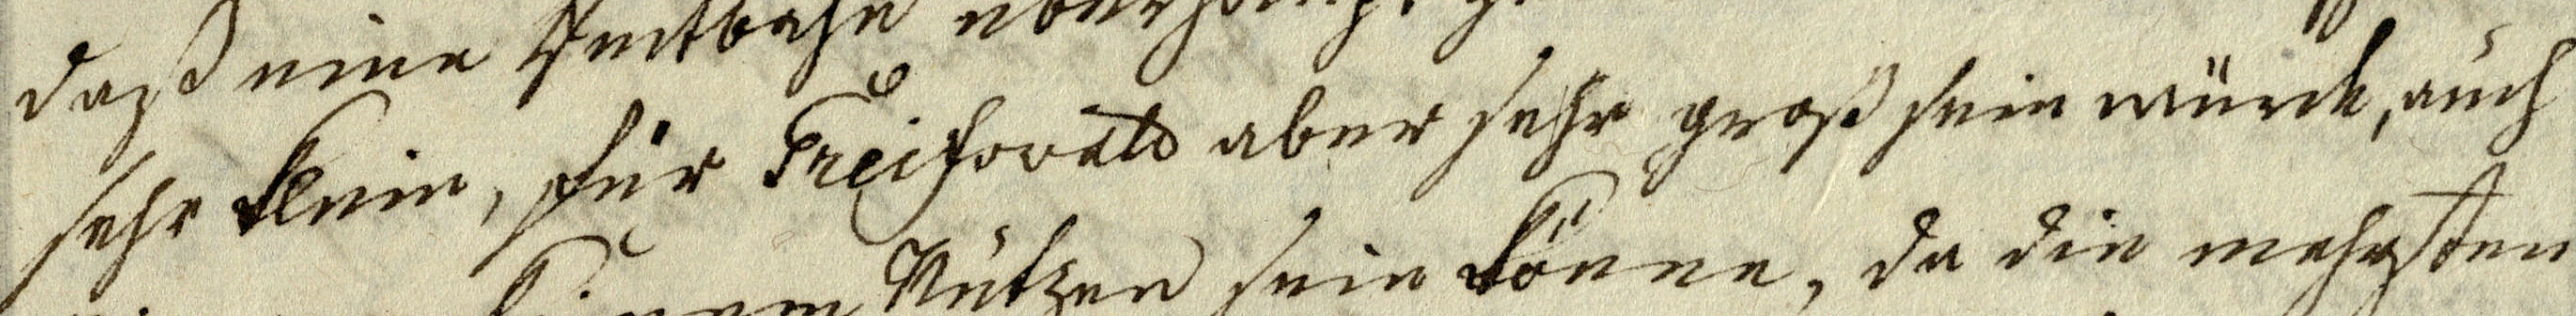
sehr klein, für Greifswald aber sehr groß sein würde, auch
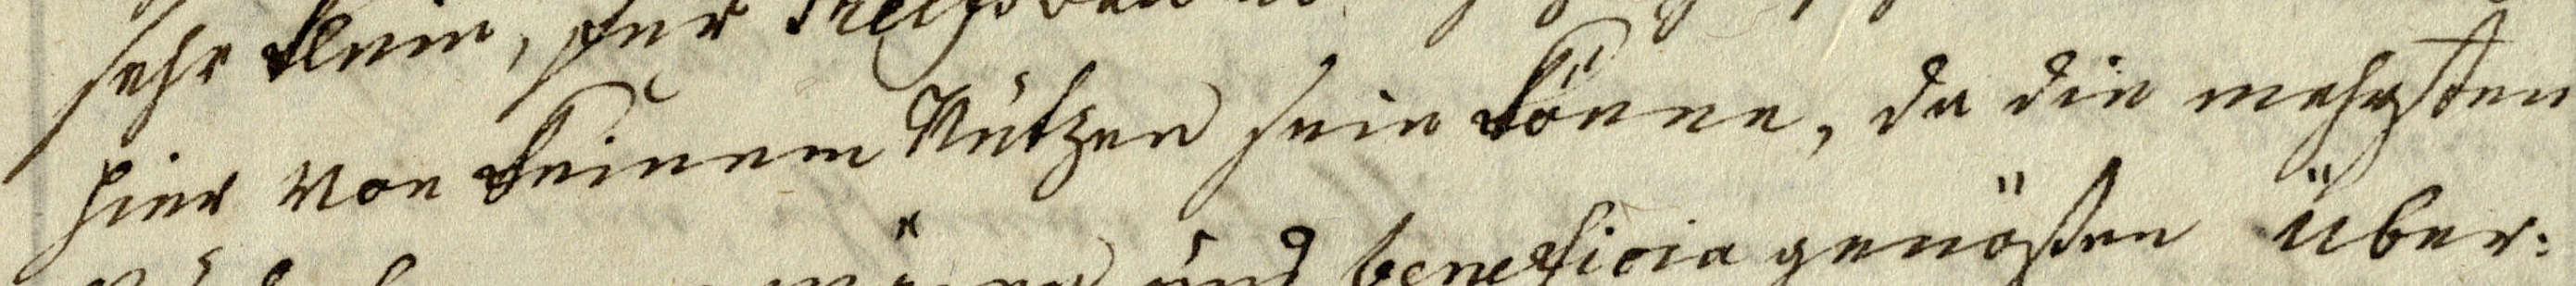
hier von keinem Nutzen sein könne, da die mehrsten
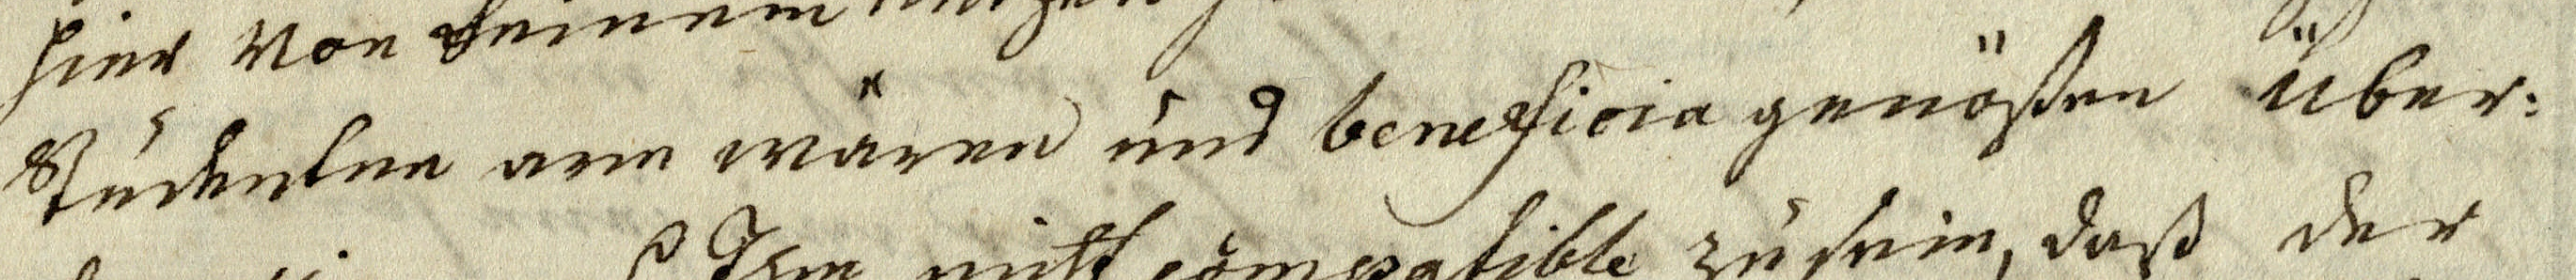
Studenten arm wären und beneficia genößen. Über¬
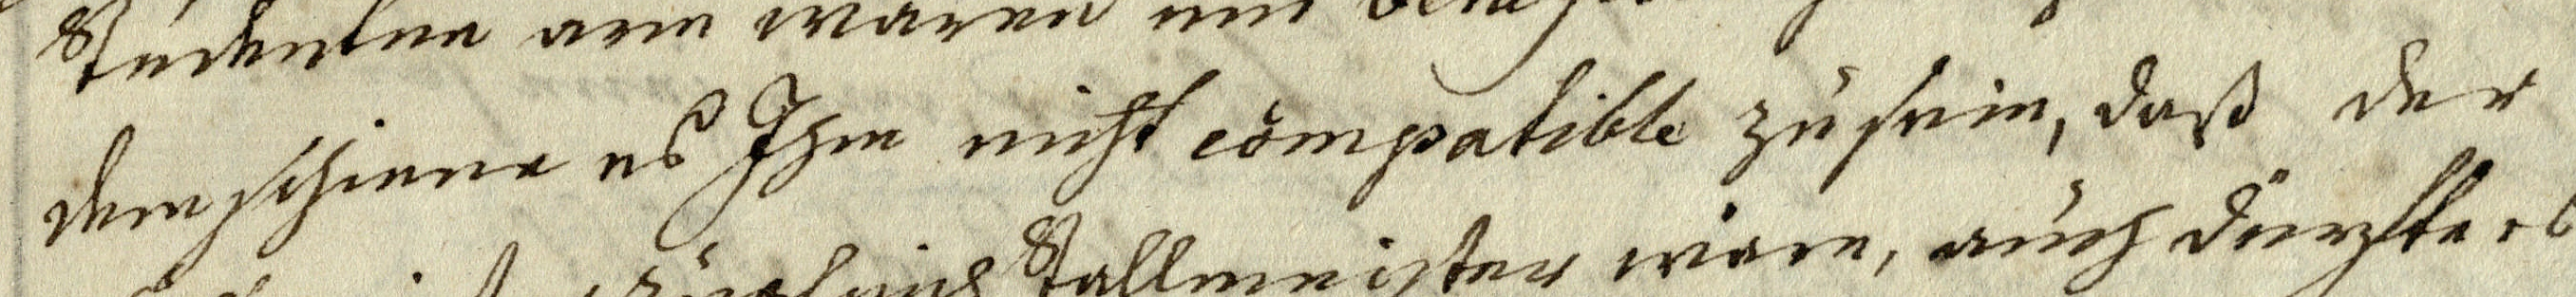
dem schiene es Ihm nicht compatible zu sein, daß der
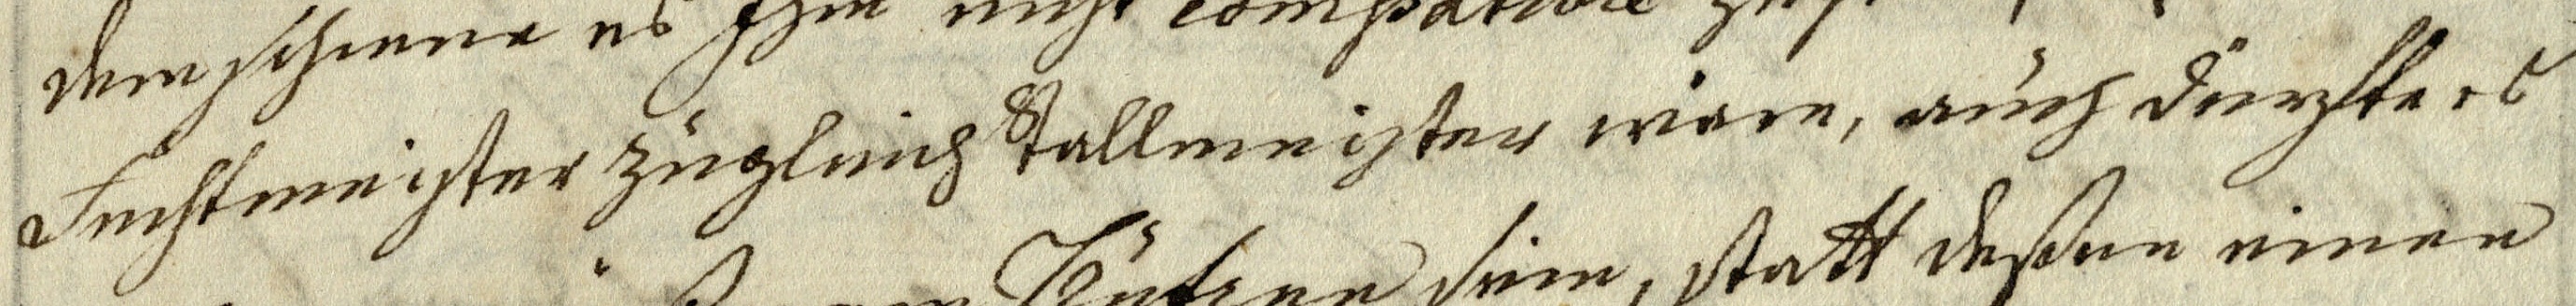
Fechtmeister zugleich Stallmeister wäre, auch dürfte es
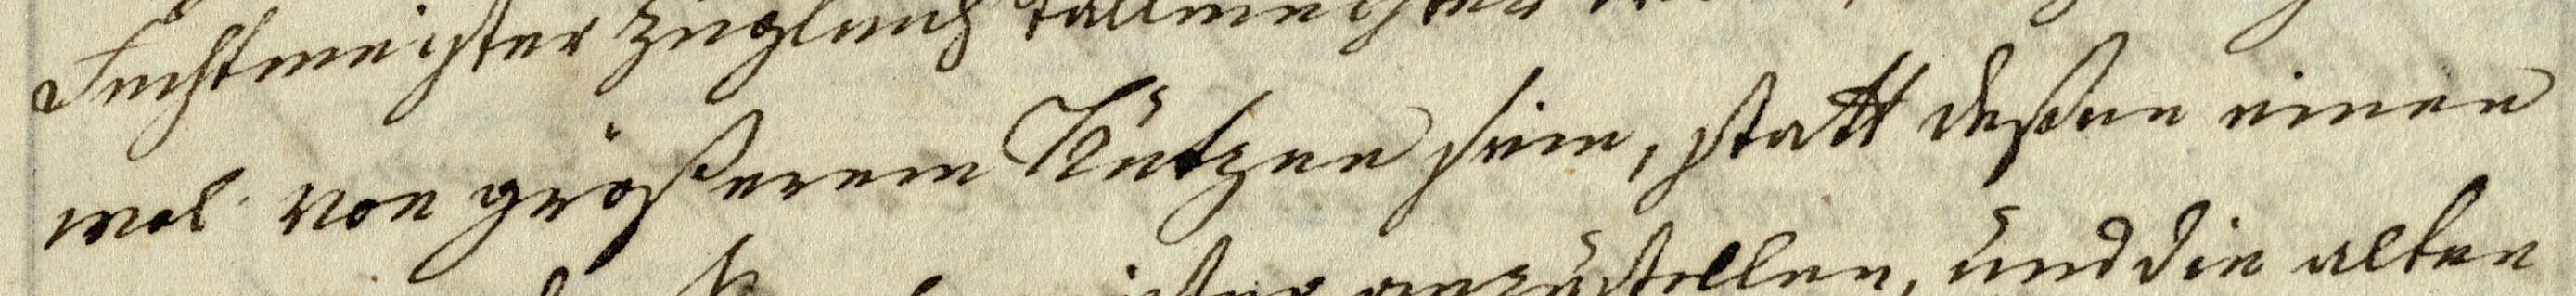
wol von größerem Nutzen sein, statt deßen einen
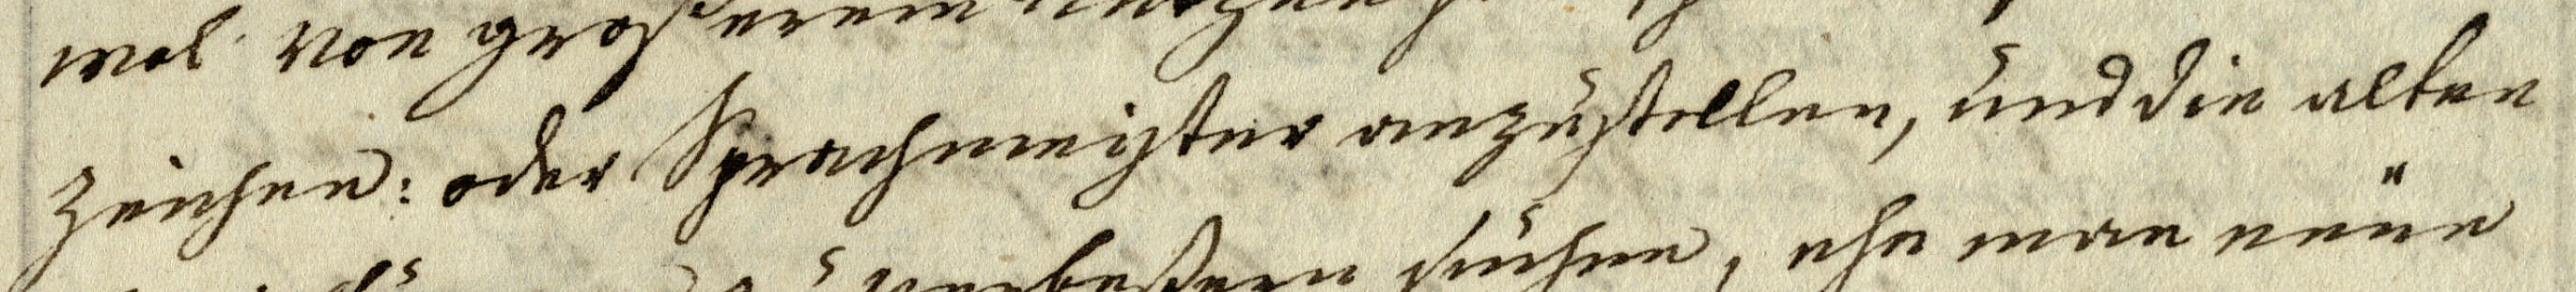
Zeichen- oder Sprachmeister anzustellen, und die alten
